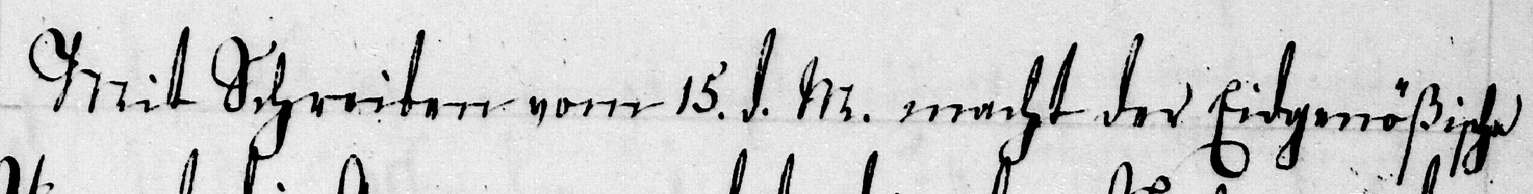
Mit Schreiben vom 15. d. M. macht der Eidgenößische
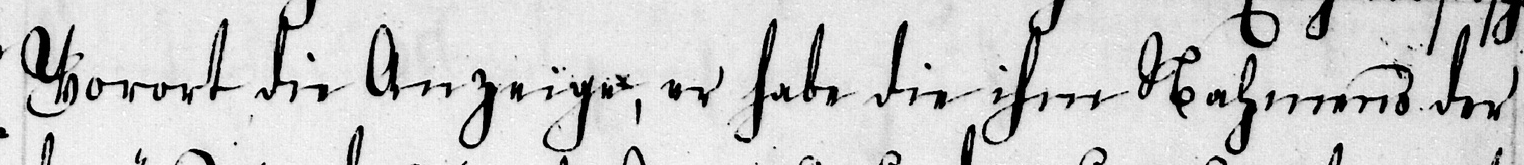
Vorort die Anzeige, er habe die ihm Nahmens der
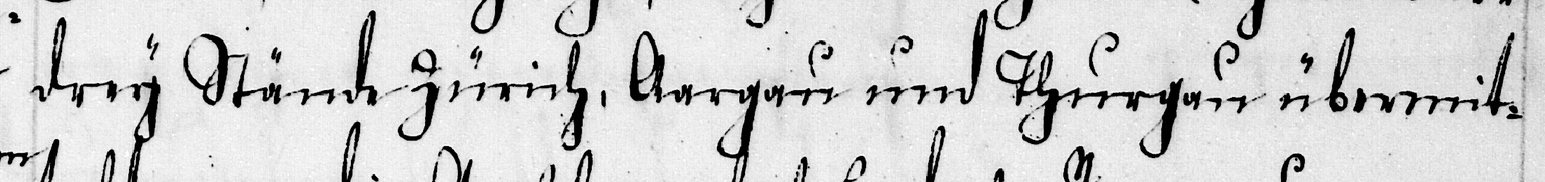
drey Stände Zürich, Aargau und Thurgau übermit¬
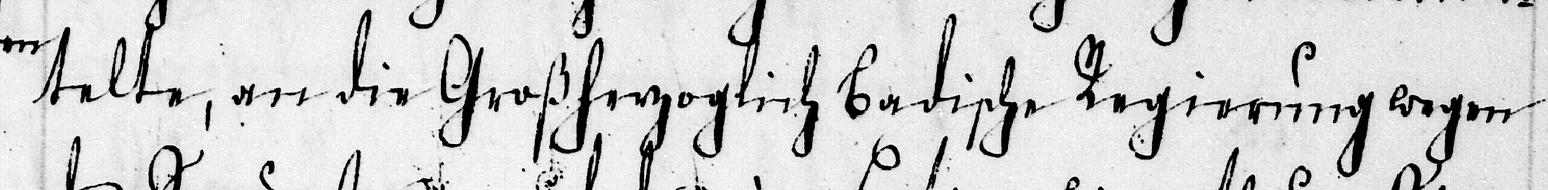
telte, an die Großherzoglich Badische Regierung wegen
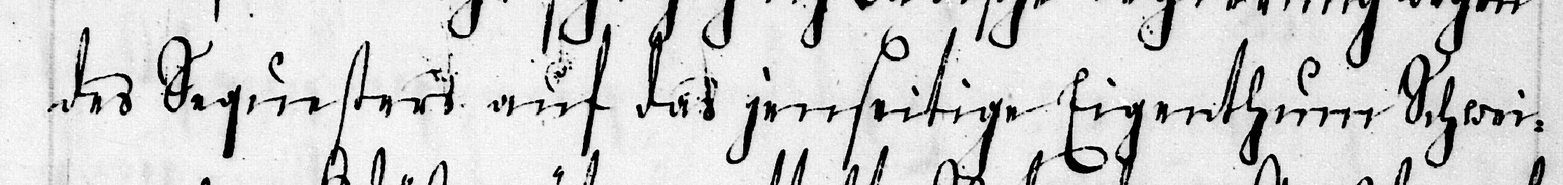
des Sequesters auf das jenseitige Eigenthum Schwei¬
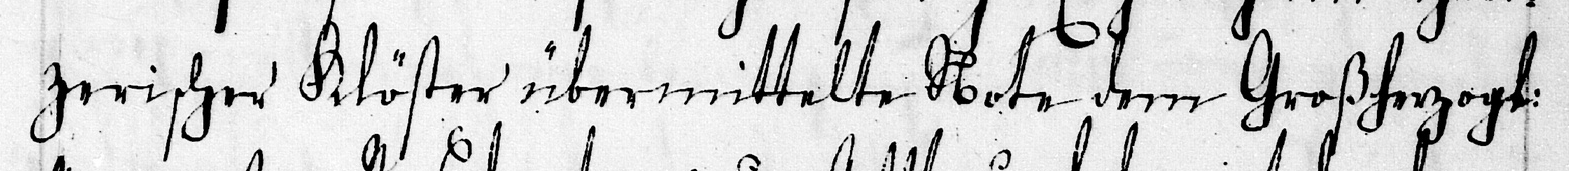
zerischer Klöster übermittelte Note dem Großherzogl.
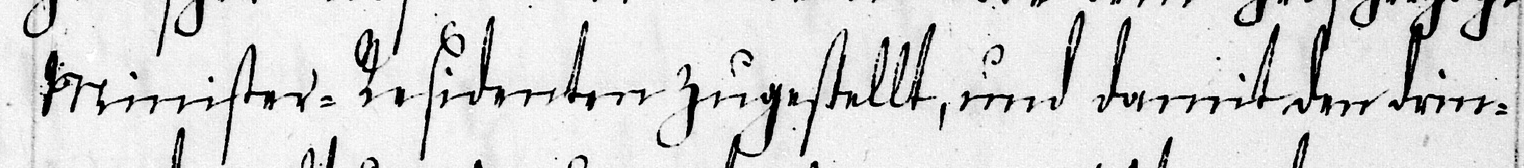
Minister-Residenten zugestellt, und damit den drin¬
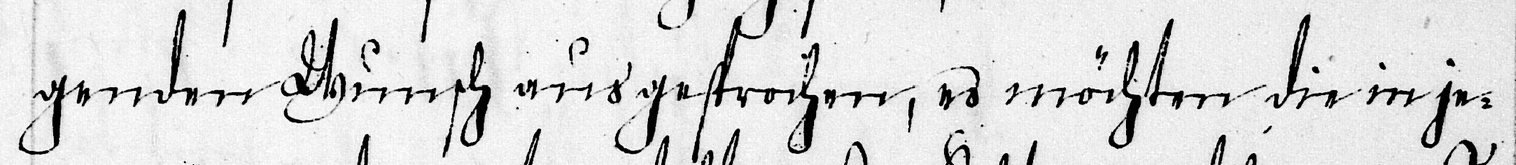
genden Wunsch ausgesprochen, es möchten die in je¬
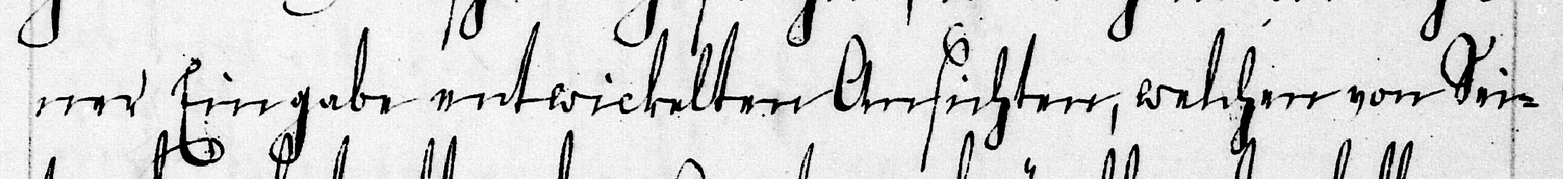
ner Eingabe entwickelten Ansichten, welchen von Sei¬
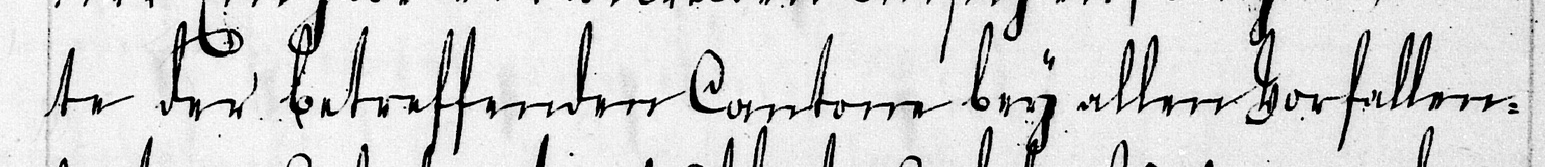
te der betreffenden Cantone bey allen Vorfallen¬
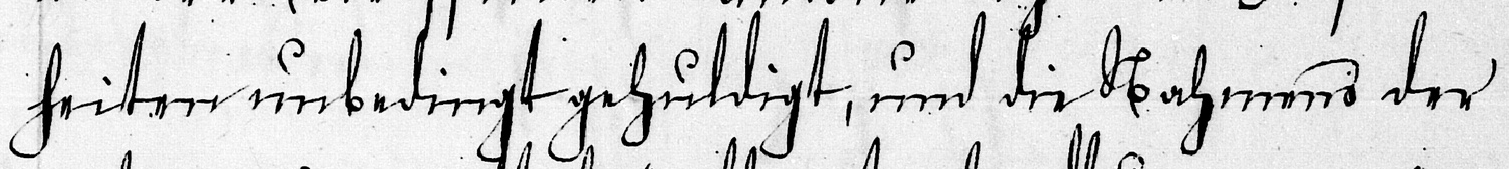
heiten unbedingt gehuldigt, und die Nahmens der
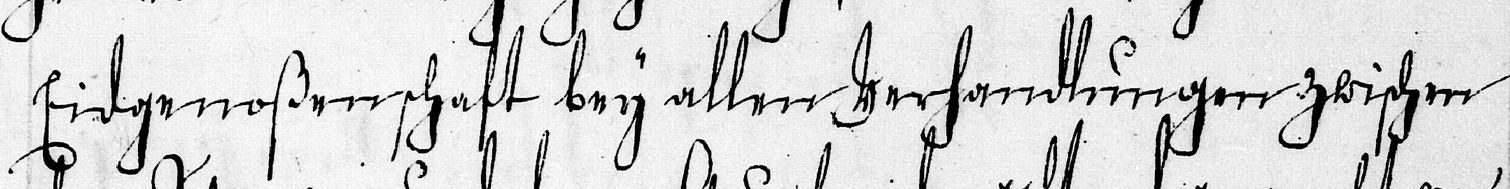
Eidgenoßenschaft bey allen Verhandlungen zwischen
